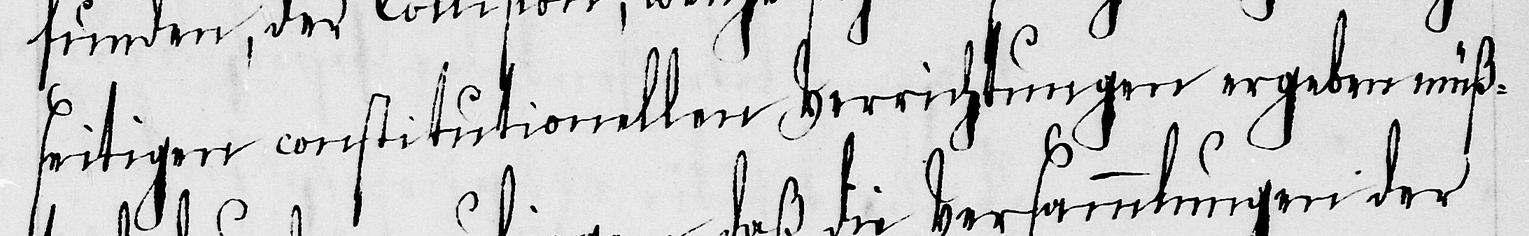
seitigen constitutionellen Verrichtungen ergeben müß¬
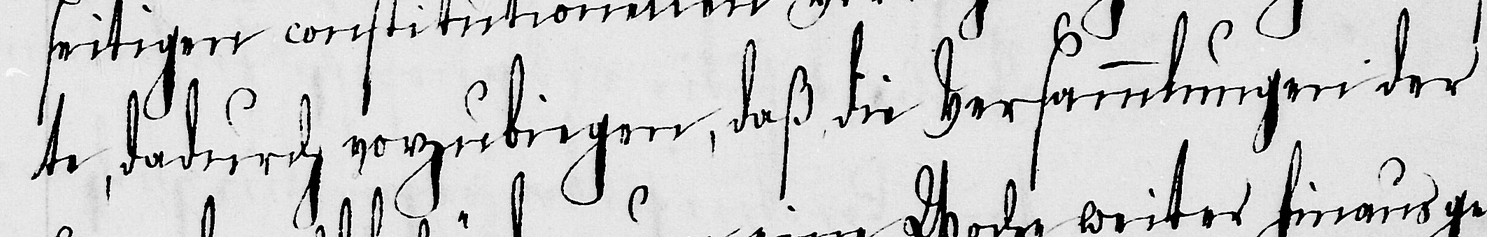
te, dadurch vorzubiegen, daß die Versammlungen der
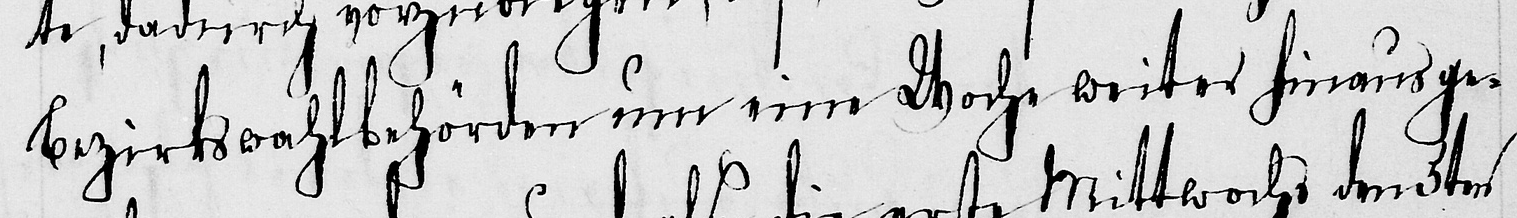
Bezirkswahlbehörden um eine Woche weiter hinausge¬
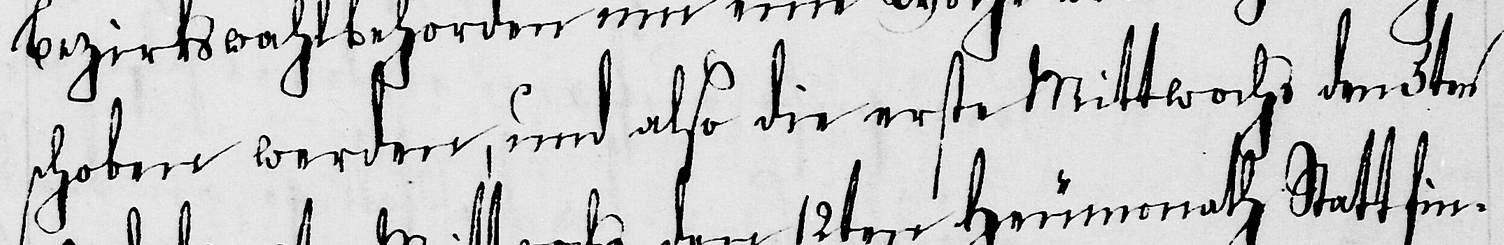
schoben werden, und also die erste Mittwochs den 5ten
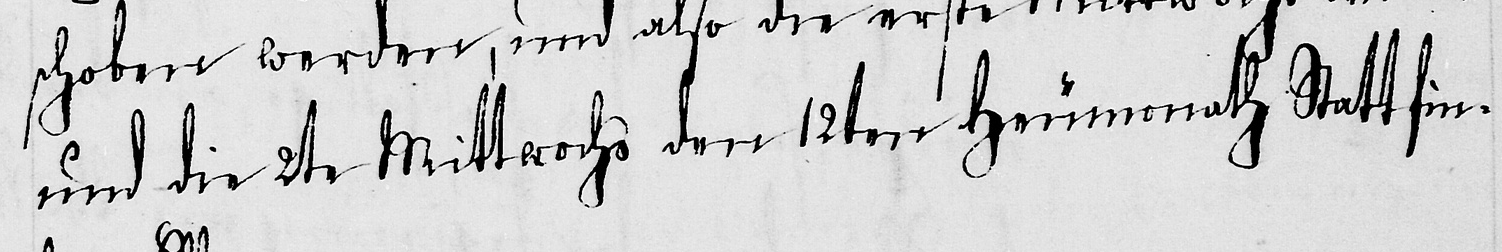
und die 2te Mittwochs den 12ten Heumonath Statt fi¬
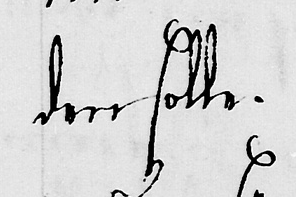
den sol¬
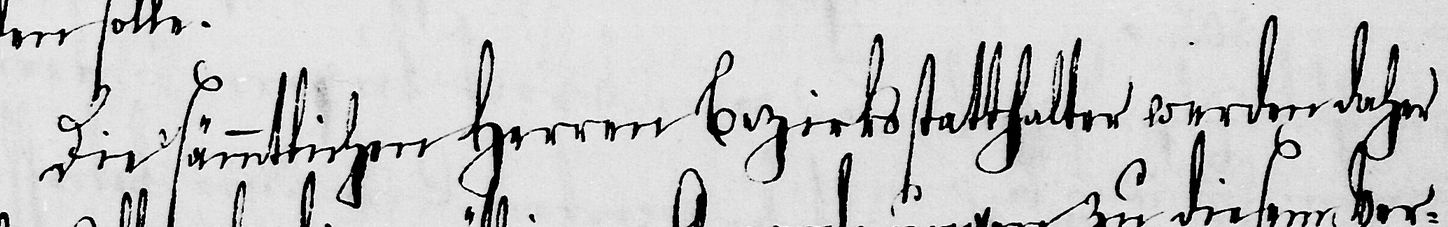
Die sämmtlichen Herren Bezirksstatthalter werden dah¬
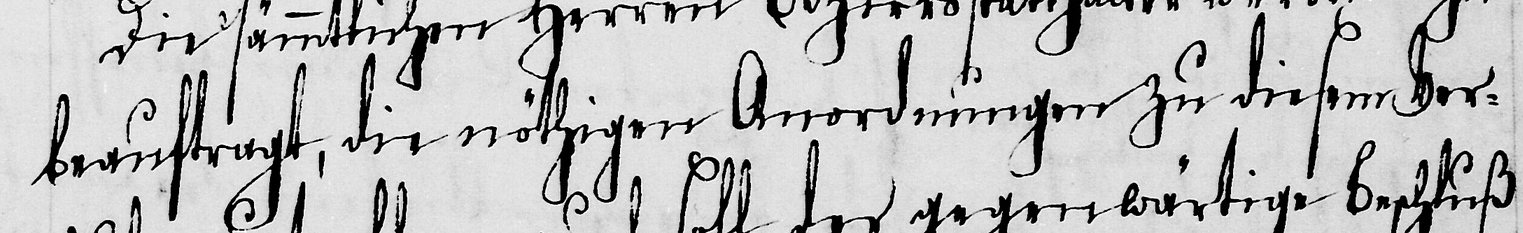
beauftragt, die nöthigen Anordnungen zu diesem Ver¬
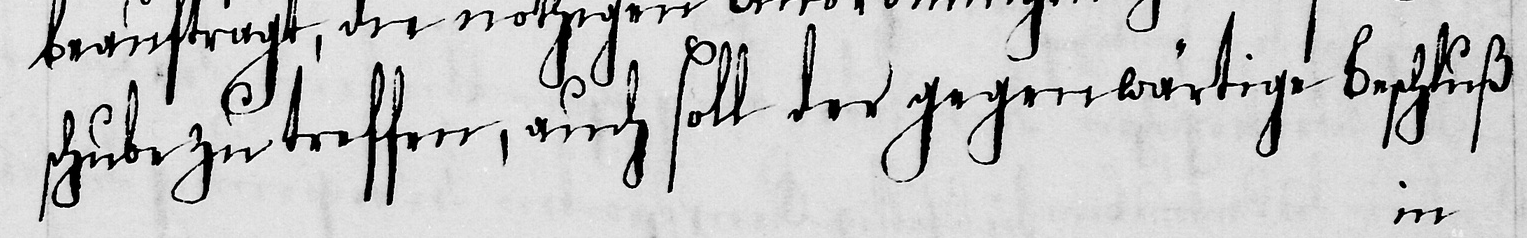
schube zu treffen, auch soll der gegenwärtige Beschluß
